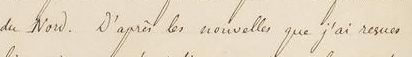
du Nord. D'après les nouvelles que j'ai reçues
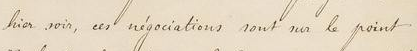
hier soir, ces négociations sont sur le point
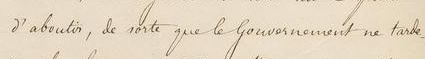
d'aboutir, de sorte que le Gouvernement ne tarde-
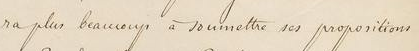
ra plus beaucoup à soumettre ses propositions
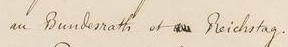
au Bundesrath et au Reichstag.
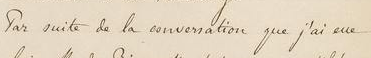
Par suite de la conversation que j'ai eu
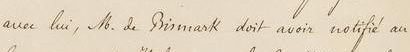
avec lui, M. de Bismark doit avoir notifié au
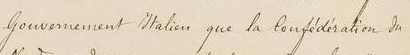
Gouvernement Italien que la Confédération du
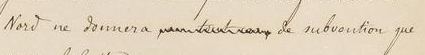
Nord ne donnera en tout cas de subvention que
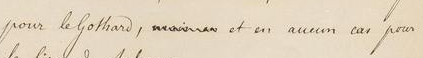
pour le Gothard, mais en et en aucun cas pour
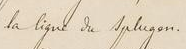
la ligne du Splugen.
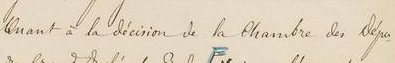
Quant à la décision de la Chambre des Dépu-
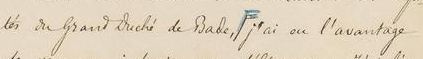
de subvention pour le Gothard, j'ai eu l' avantage
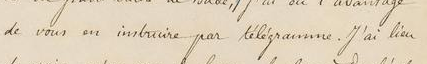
de vous en instruire par télégramme. J'ai lieu
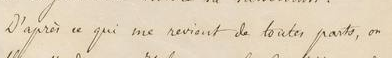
D'après ce qui me revient de toutes parts, on
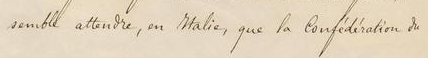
semble attendre, en Italie, que la Confédération du
